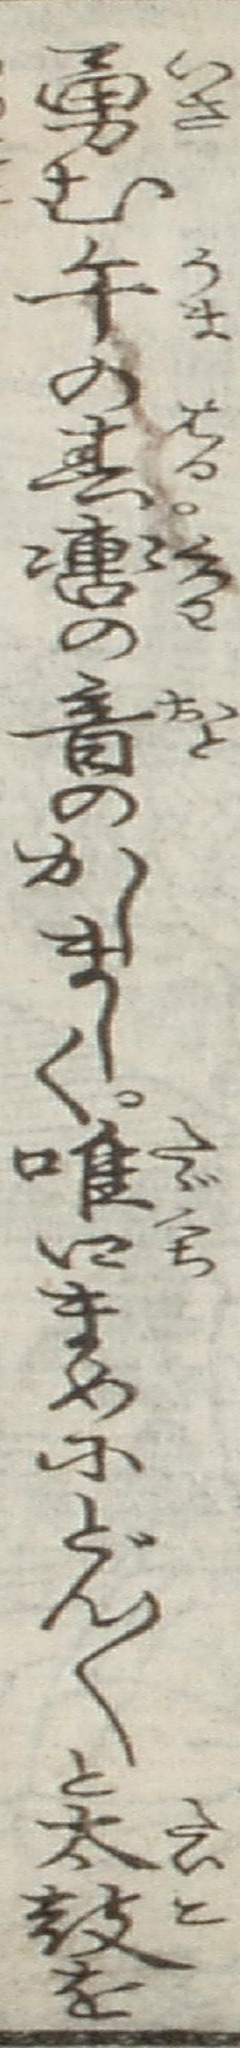勇む午の春。轡の音のかしましく。唯口まめにどん〳〵と太鼓を
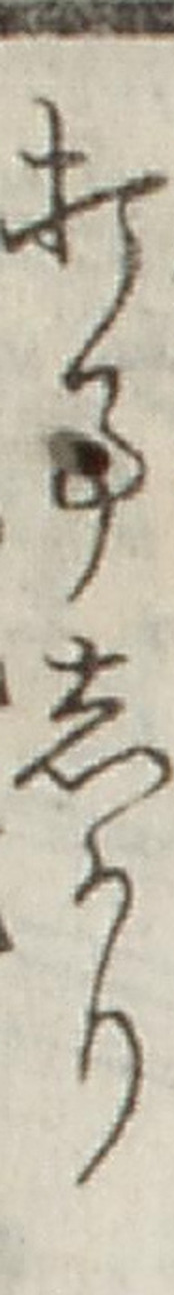打事しかり
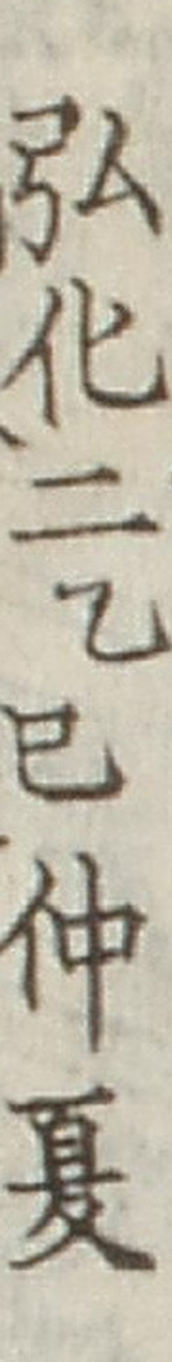弘化二乙巳仲夏

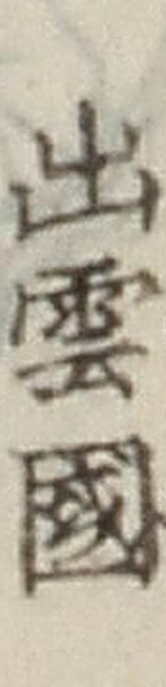出雲國
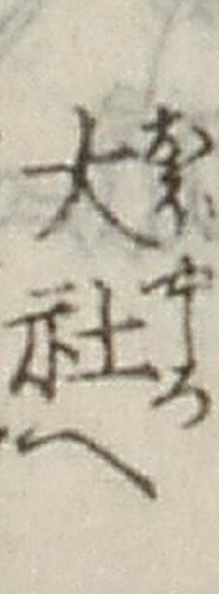大社へ
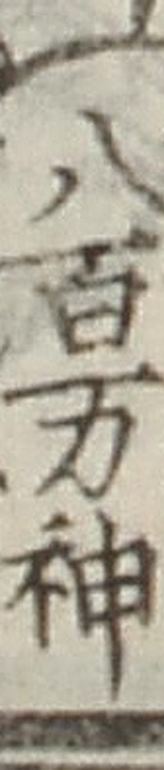八百万神

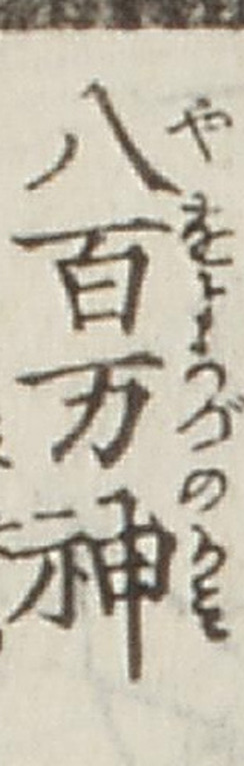八百万神
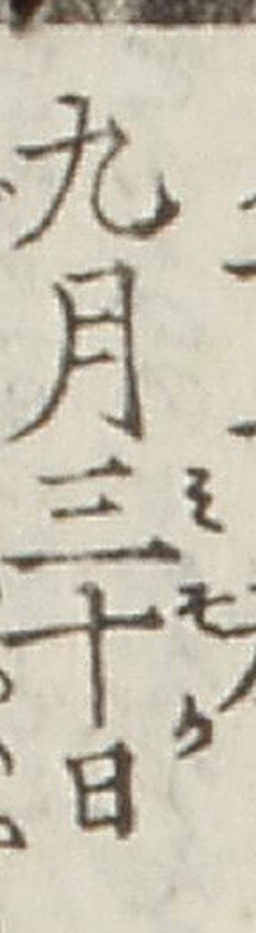九月三十日
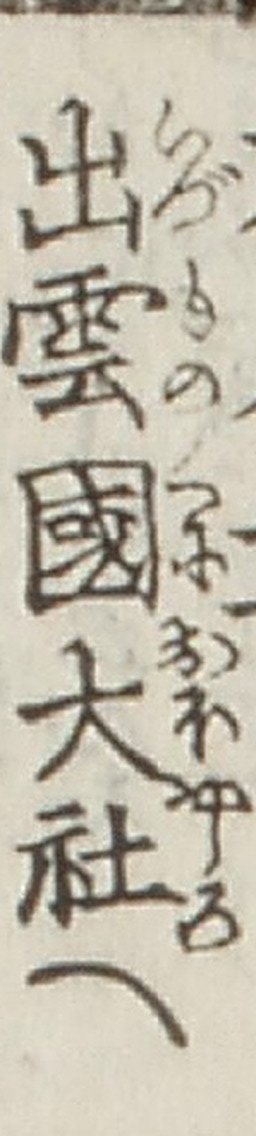出雲國大社へ
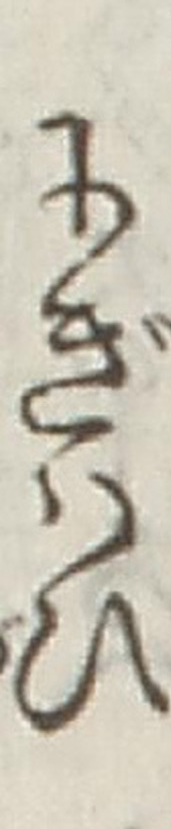にぎハひ

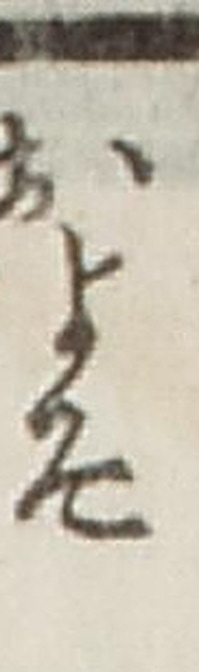およそ
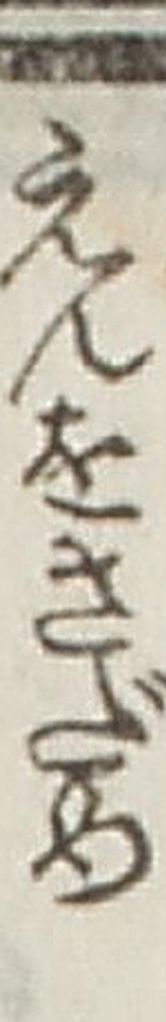えんをさだめ
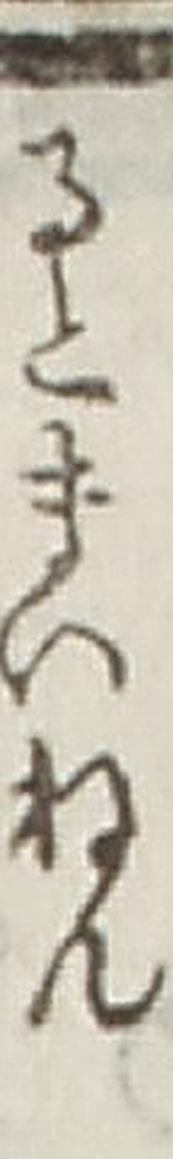るとまいねん
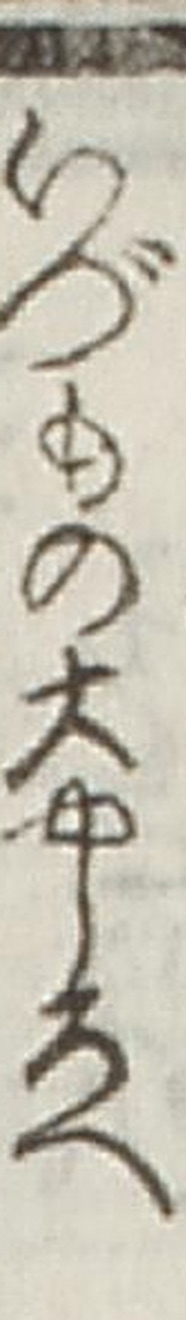いづもの大やしろへ
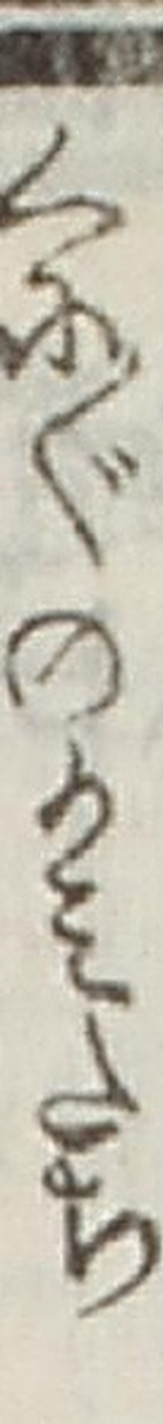くに〴〵のかみたち
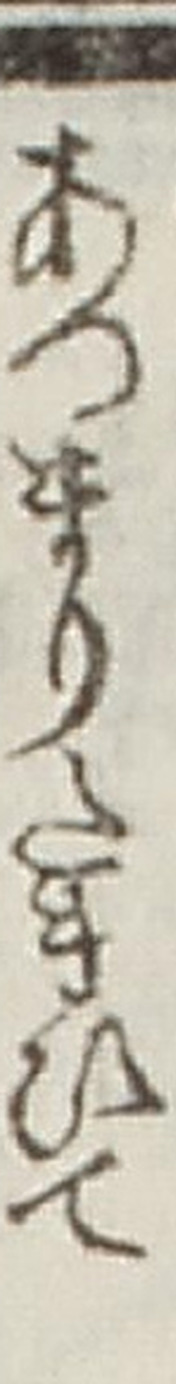あつまりたまひて
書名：三世相出雲當座帳　上下冊
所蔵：東京大学地震研究所図書室 Earthquake Research Institute Library, The University of Tokyo, JAPAN
